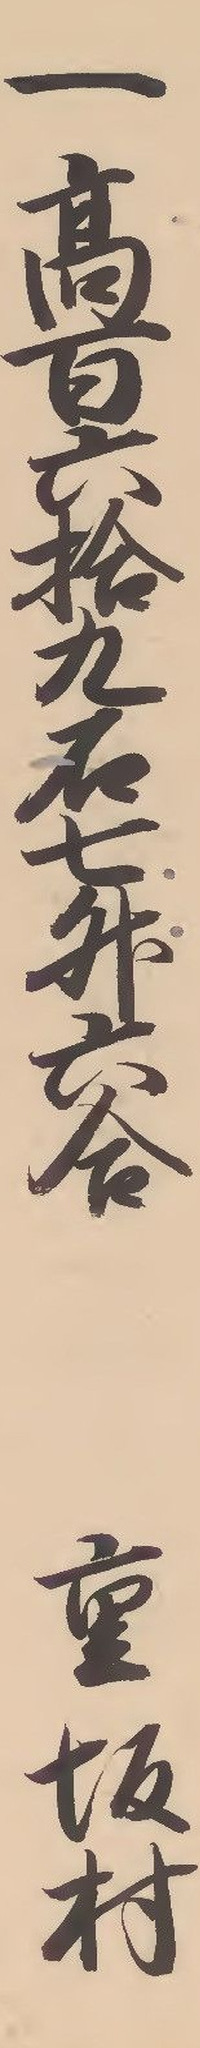一高百六拾九石七升六合重坂村

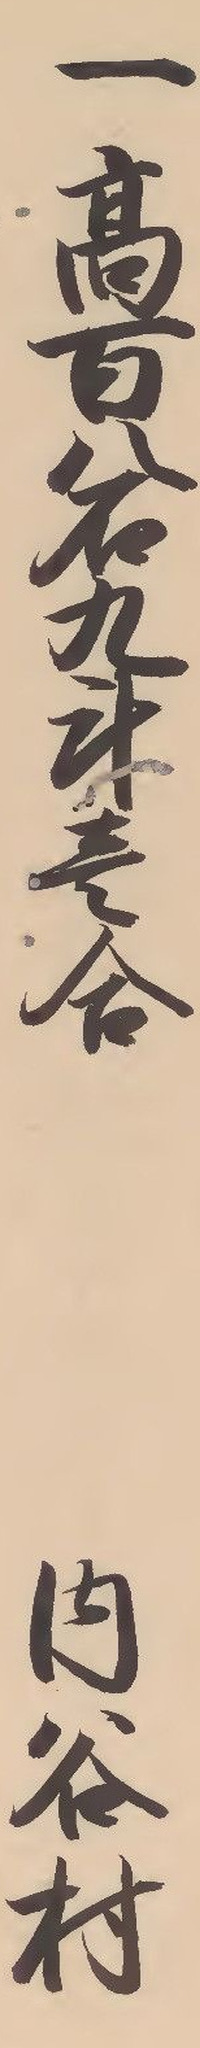一高百八石九斗壱合内谷村
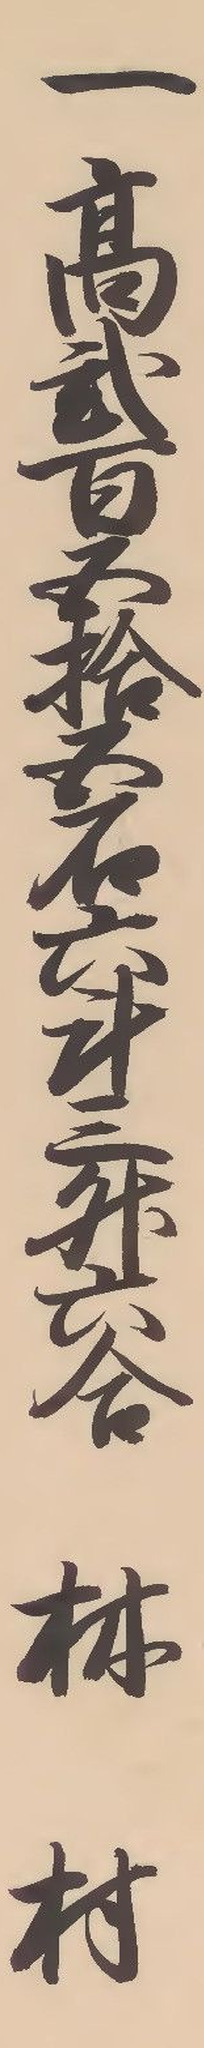一高弐百五拾五石六斗三升六合林村
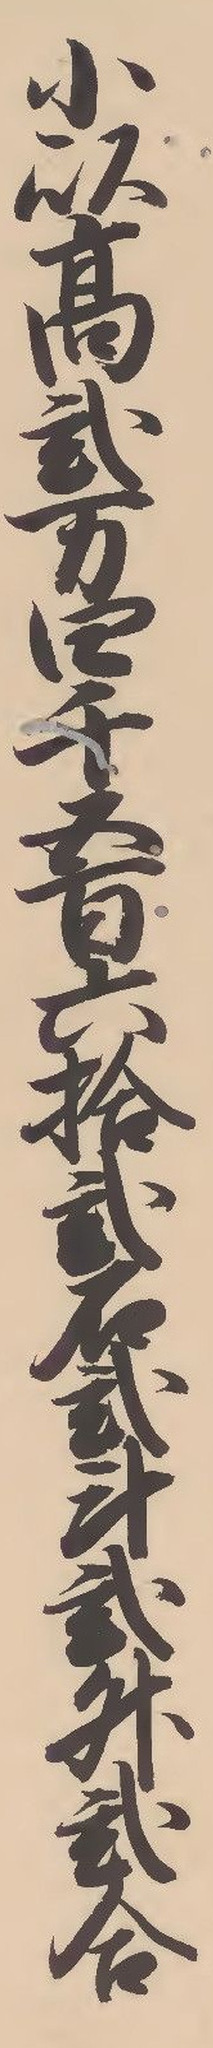小以高弐万四千五百六拾弐石弐斗弐升弐合

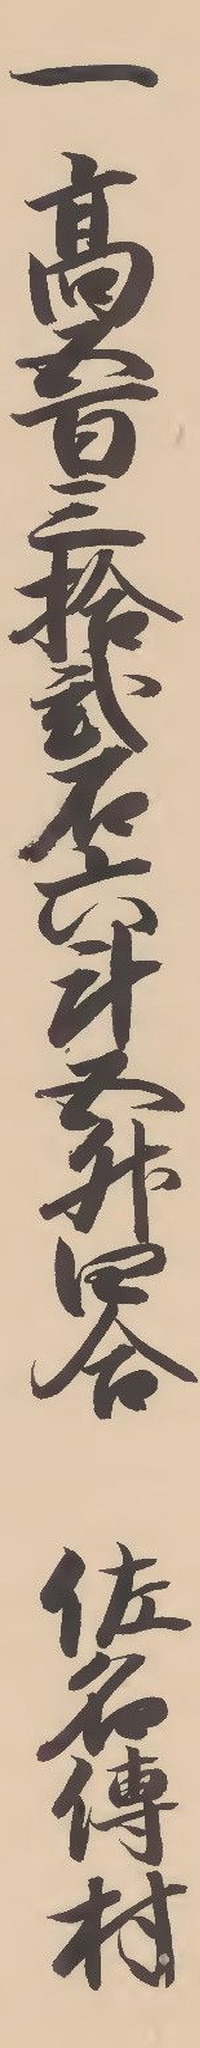一高五百三拾弐石六斗五升四合佐名伝村
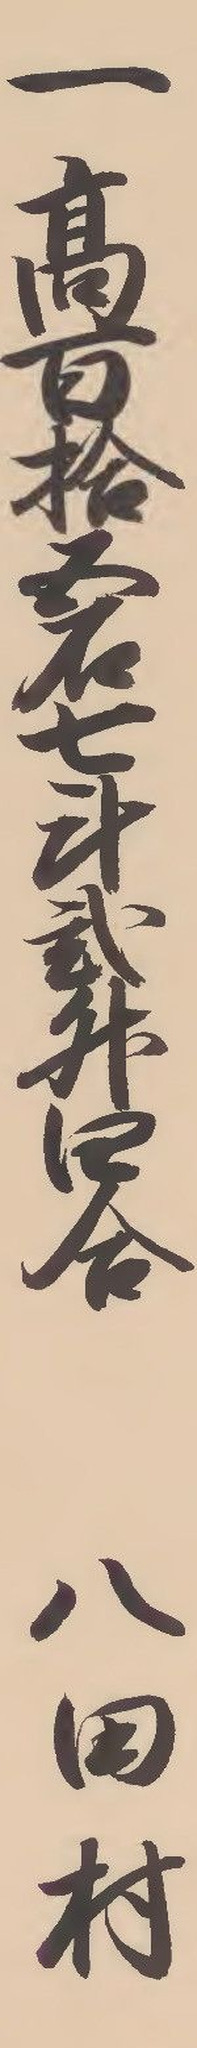一高百拾五石七斗弐升四合八田村
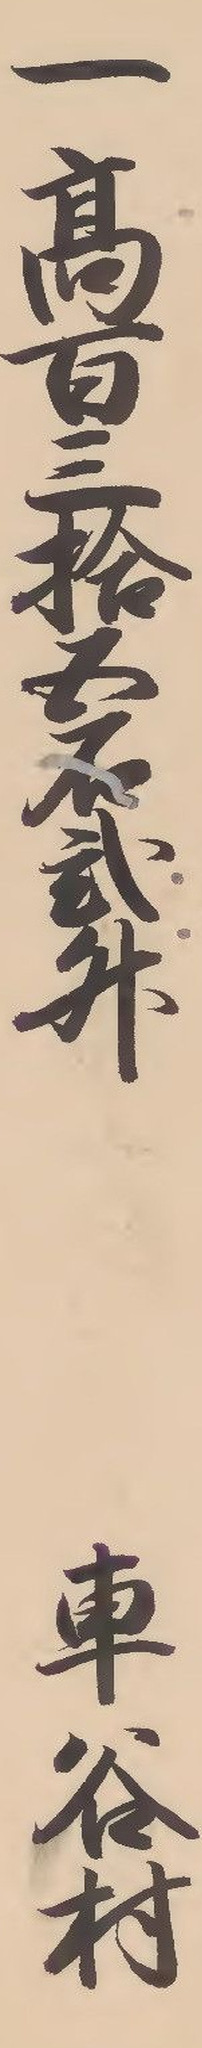一高百三拾五石弐升車谷村

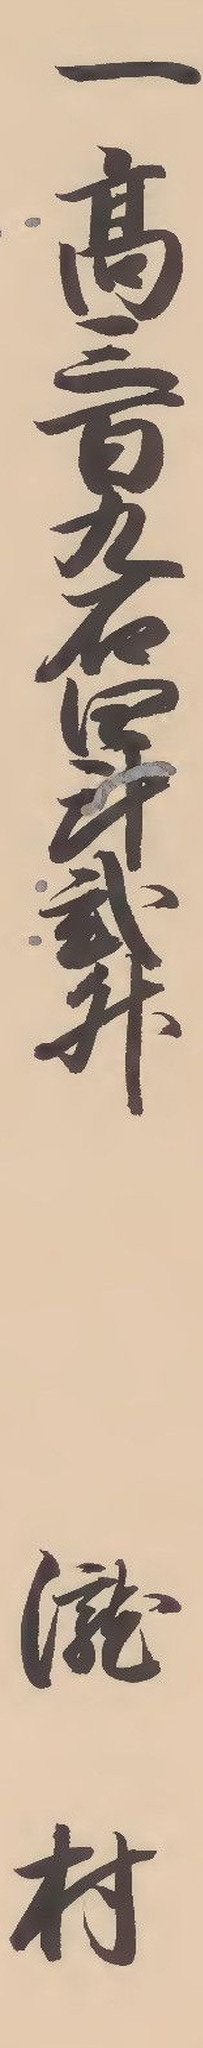一高三百九石四斗弐升滝村
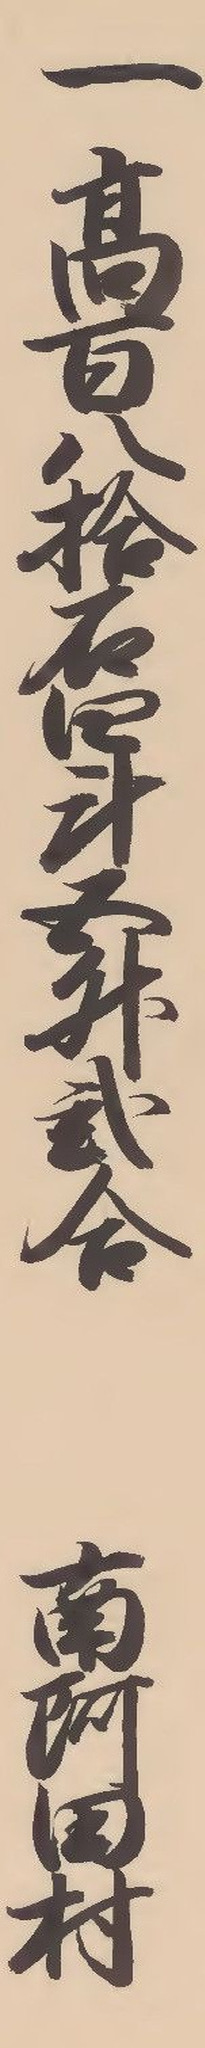一高百八拾石四斗五升弐合南阿田村
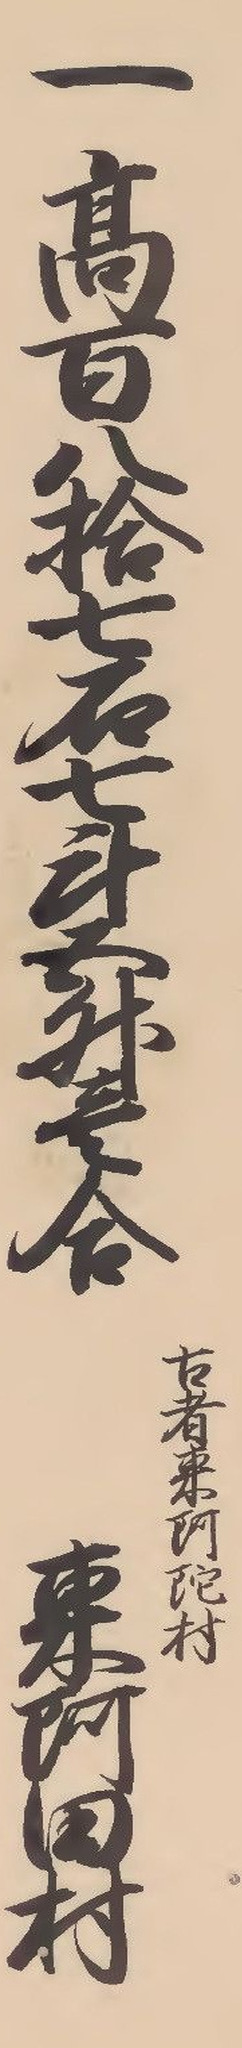一高百八拾石四斗五升弐合南阿田村
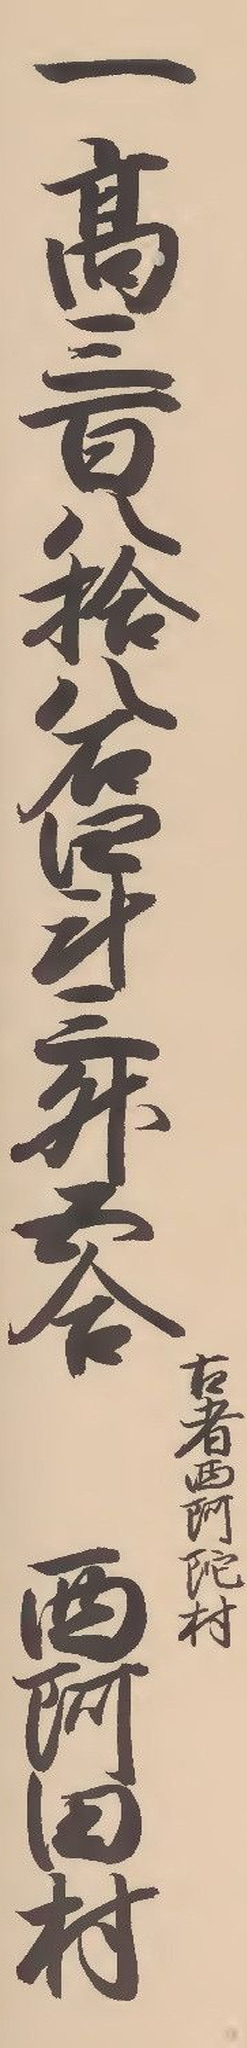一高百八拾石四斗五升弐合南阿田村
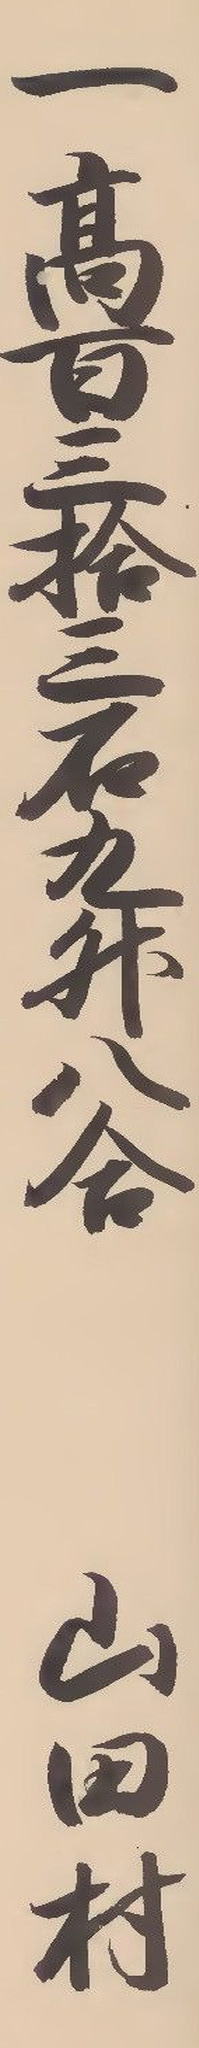一高百三拾三石九升八合山田村
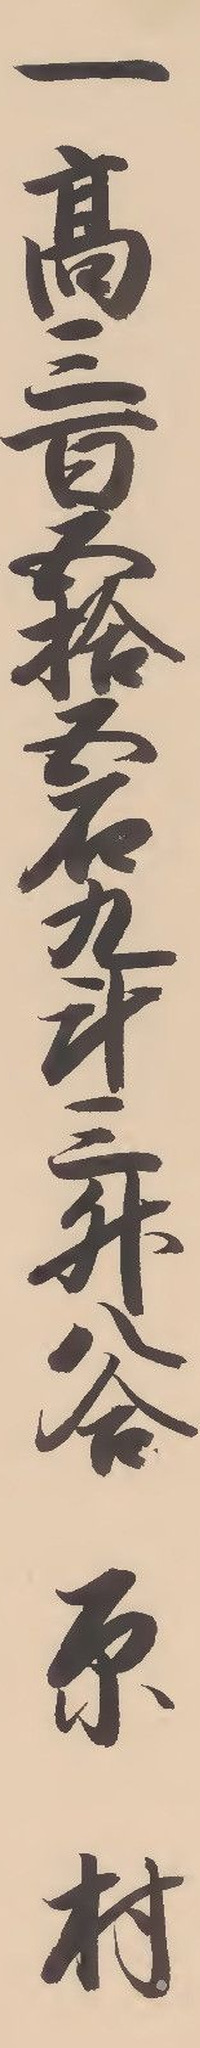一高三百五拾五石九斗三升八合原村

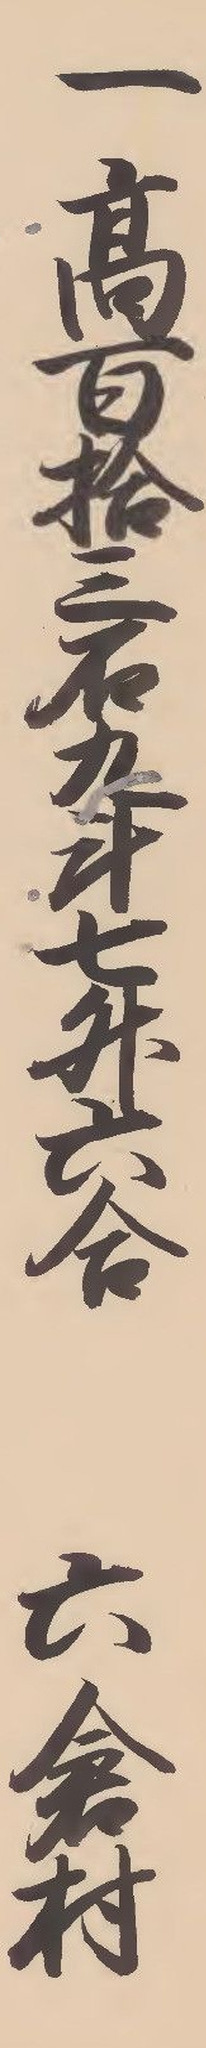一高百拾三石九斗七升六合六倉村
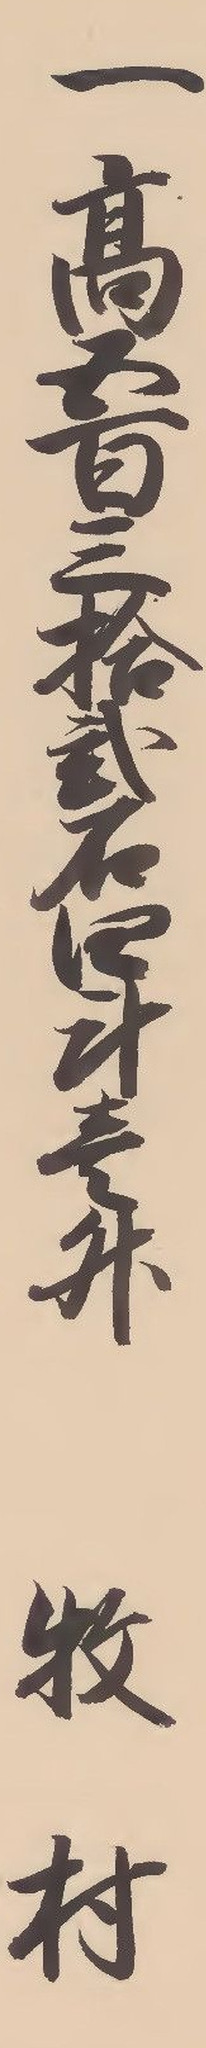一高五百三拾弐石四斗壱升牧村
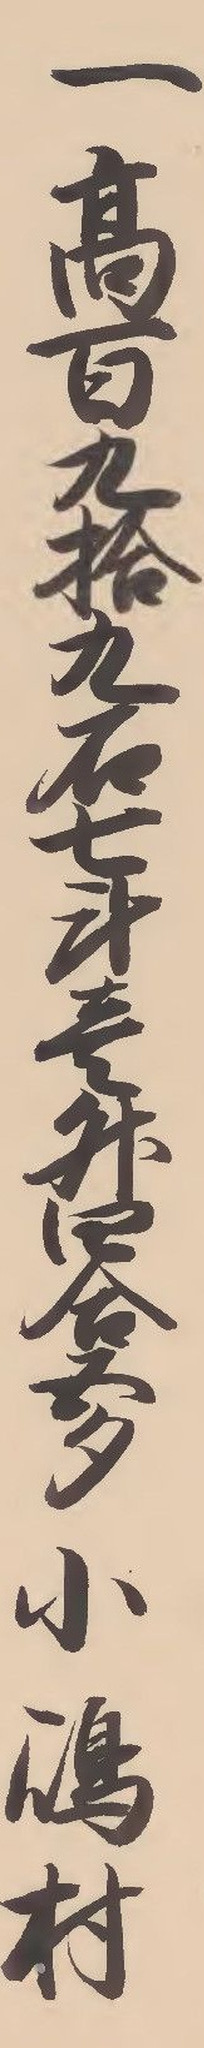一高百九拾九石七斗壱升四合五勺小島村
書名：大和国郷帳
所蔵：国立公文書館 National Archives of Japan
